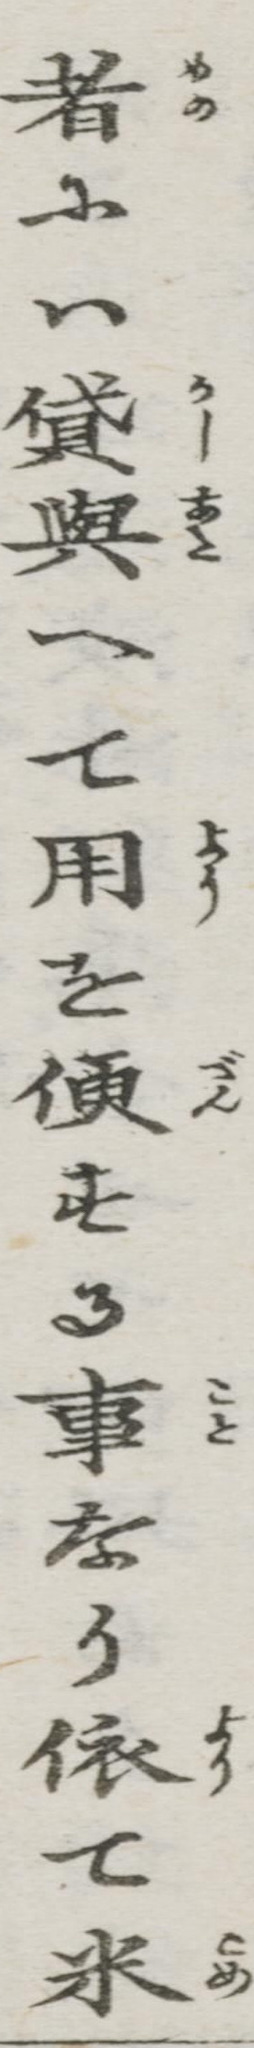者には貸与へて用を便する事なり依て米
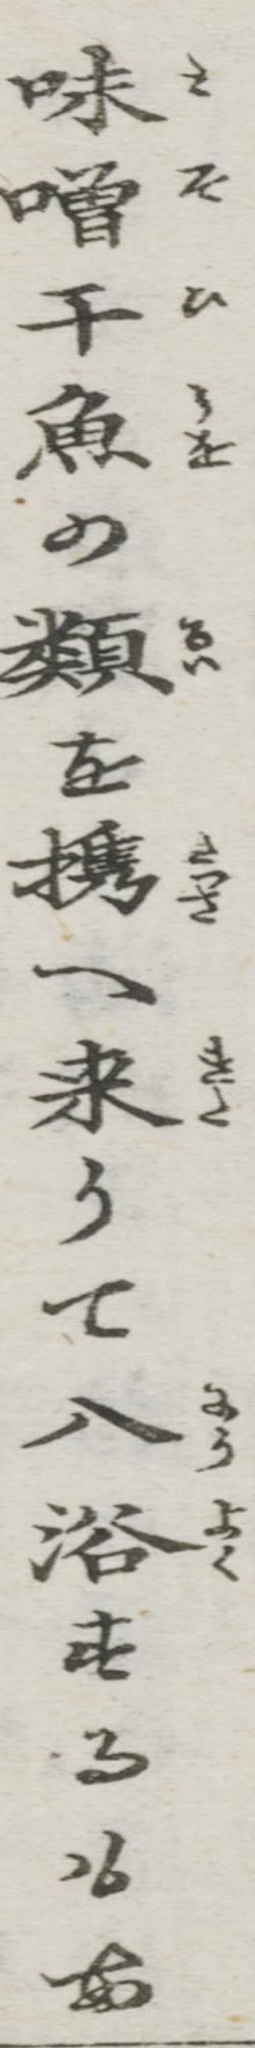味噌干魚の類を携へ来りて入浴するもあ
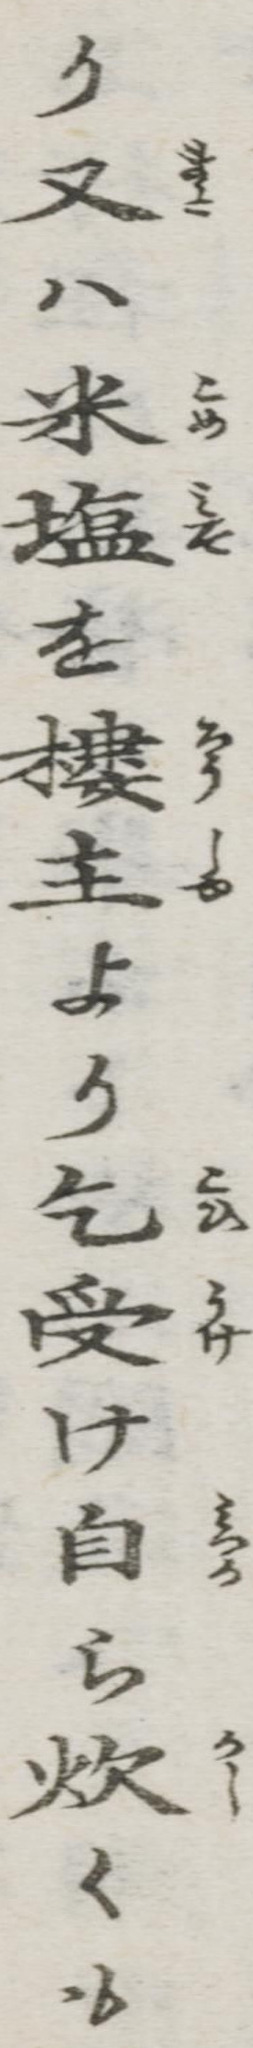り又は米塩を楼主より乞受け自ら炊くも
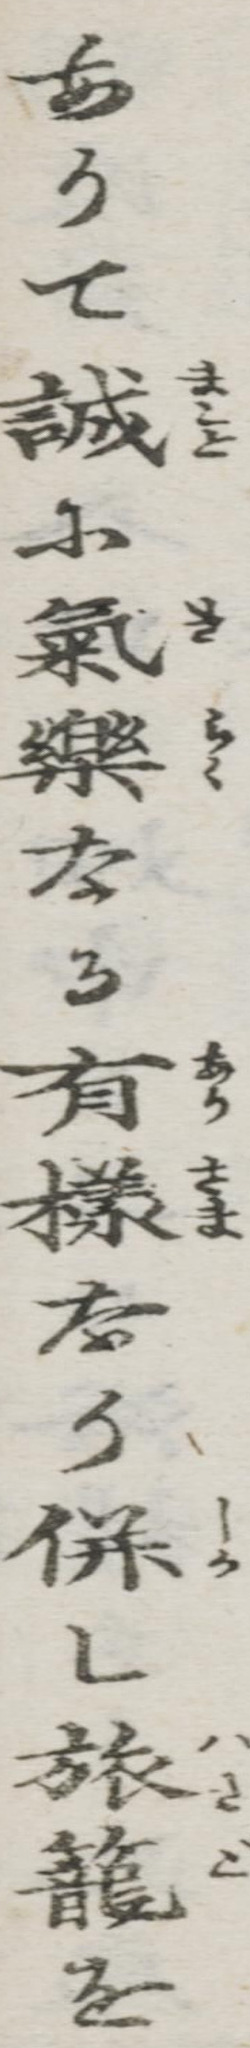ありて誠に気楽なる有様なり併し旅籠を
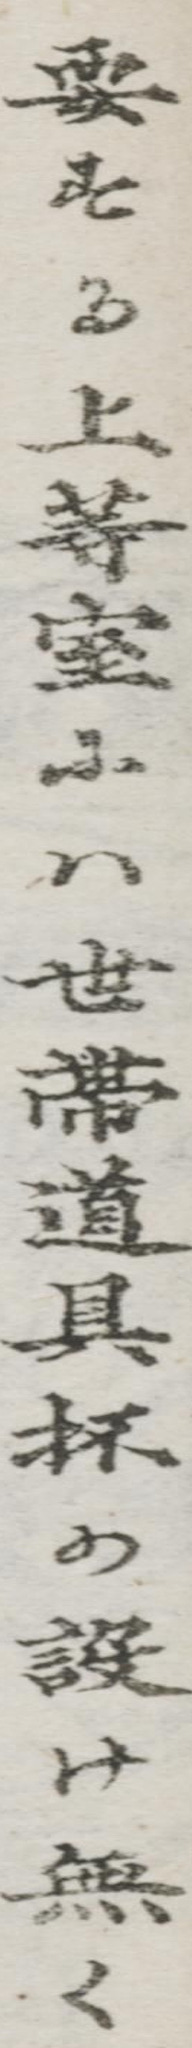要する上等室には世帯道具等の設け無く
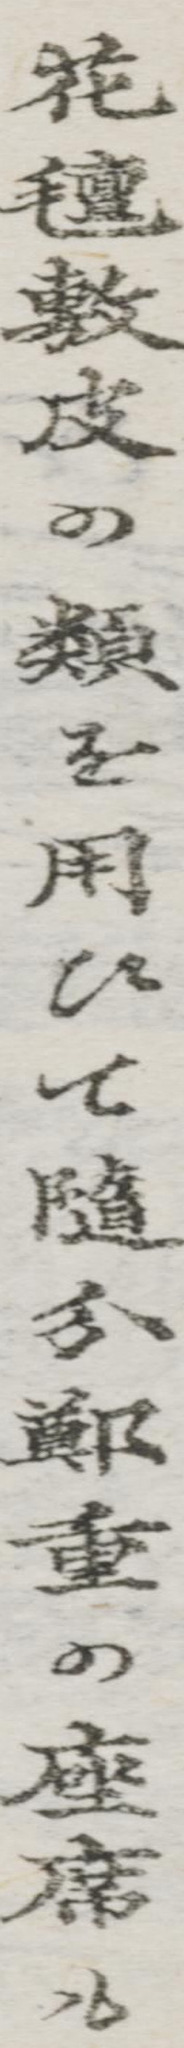花氈敷皮の類を用ひて随分鄭重の座席も
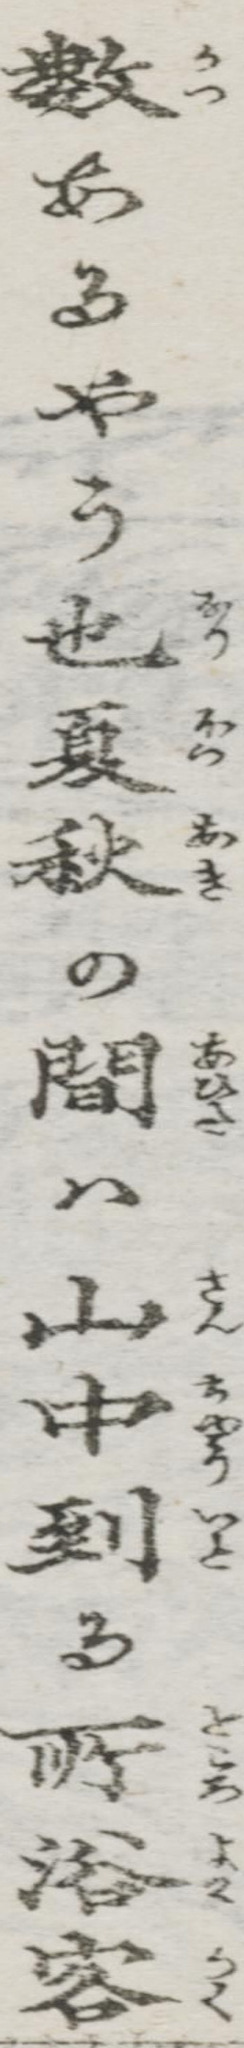数あるやう也夏秋の間は山中到る所浴客
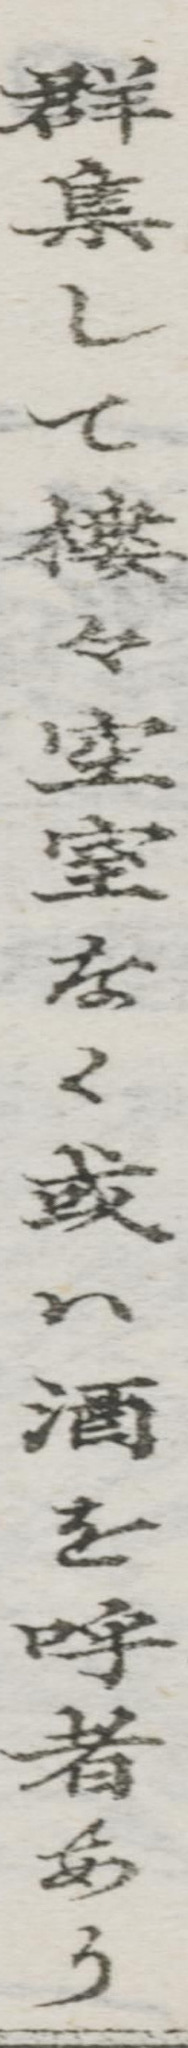群集して楼々空室なく或は酒を呼者あり
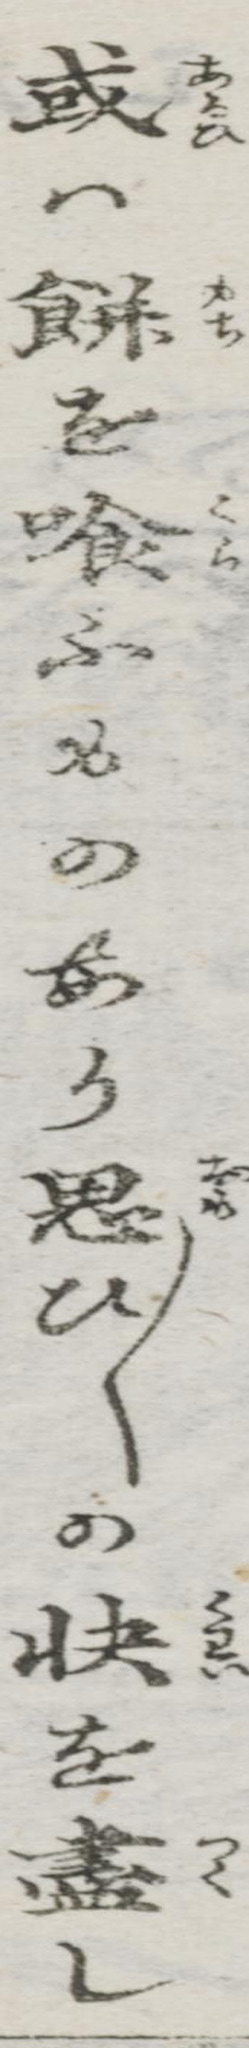或は餅を喰ふものあり思ひ〳〵の快を尽し
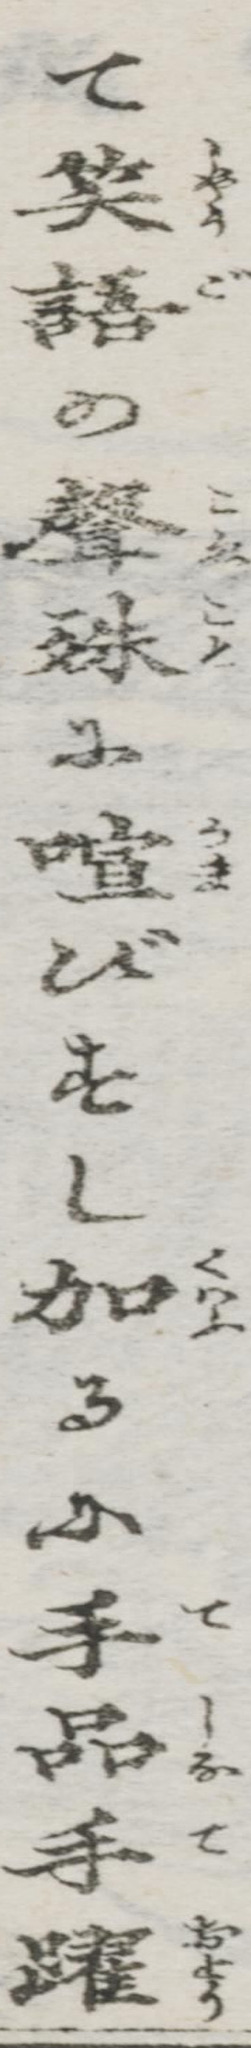て笑語の声殊に喧びすし加るに手品手躍
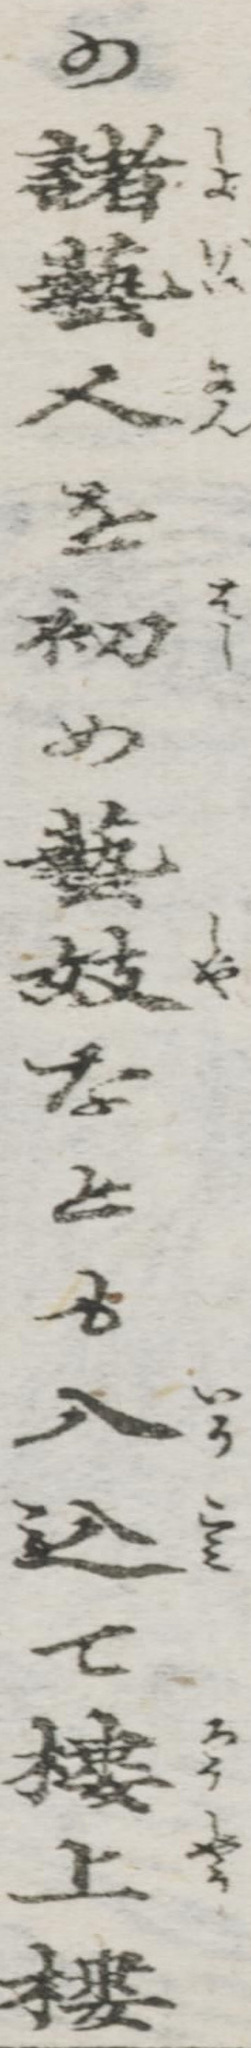の諸芸人を初め芸伎なとも入込て楼上楼
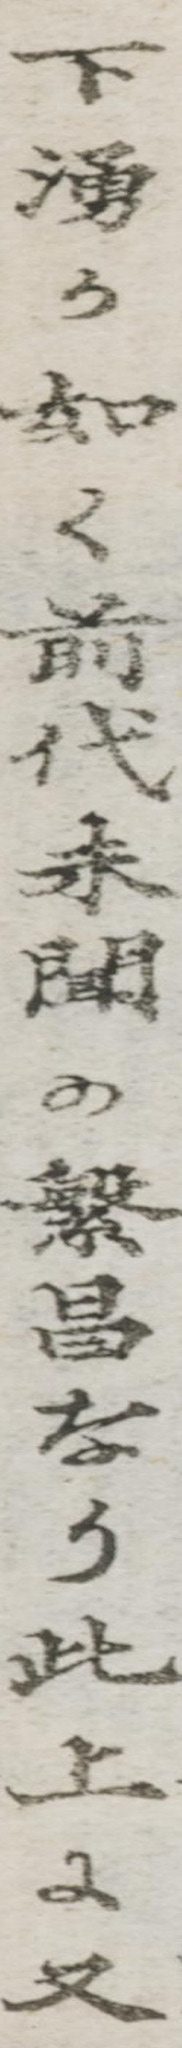下湧か如く前代未聞の繁昌なり此上に又

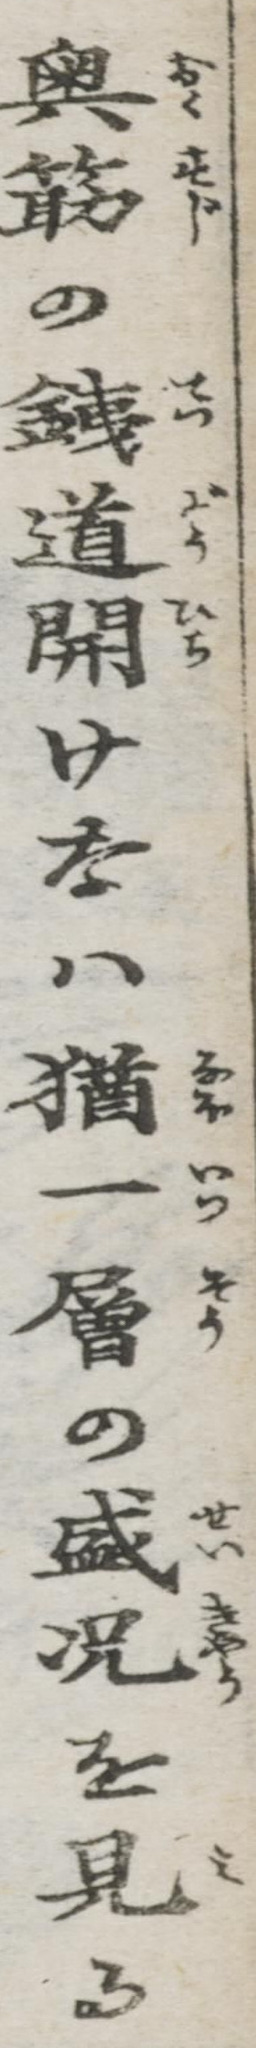奥筋の鉄道開けなハ猶一層の盛況を見る
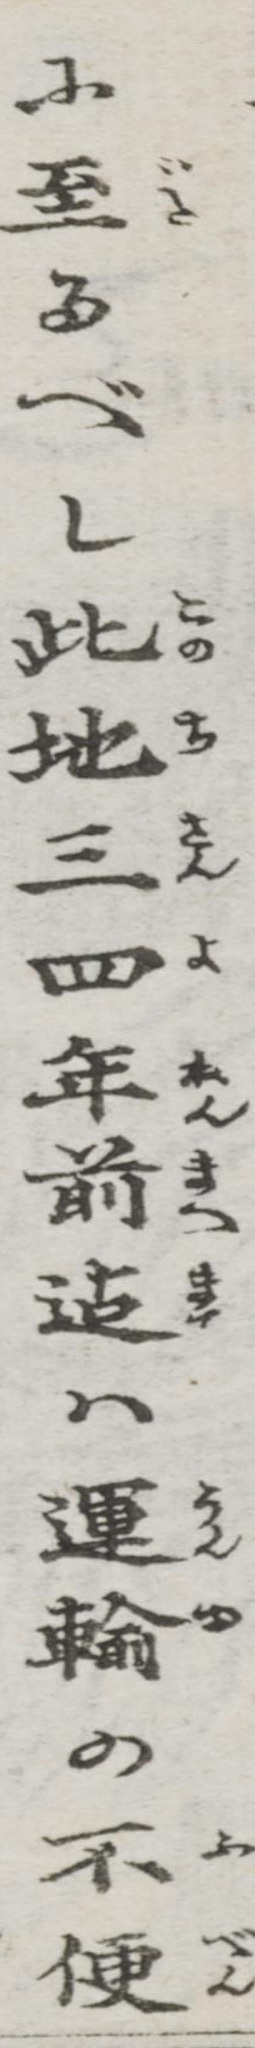に至るべし此地三四年前迄ハ運輸の不便
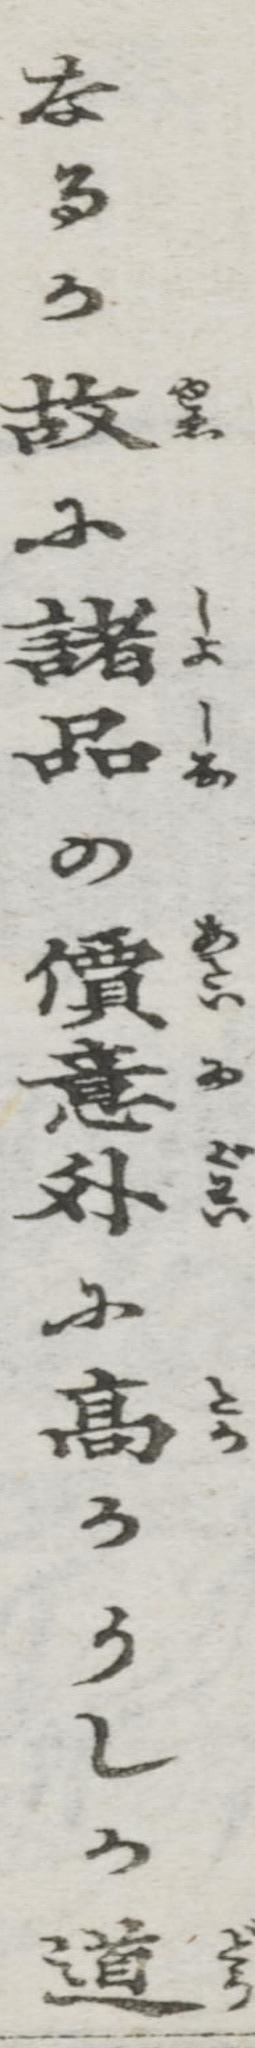なるか故に諸品の價意外に高かりしか道
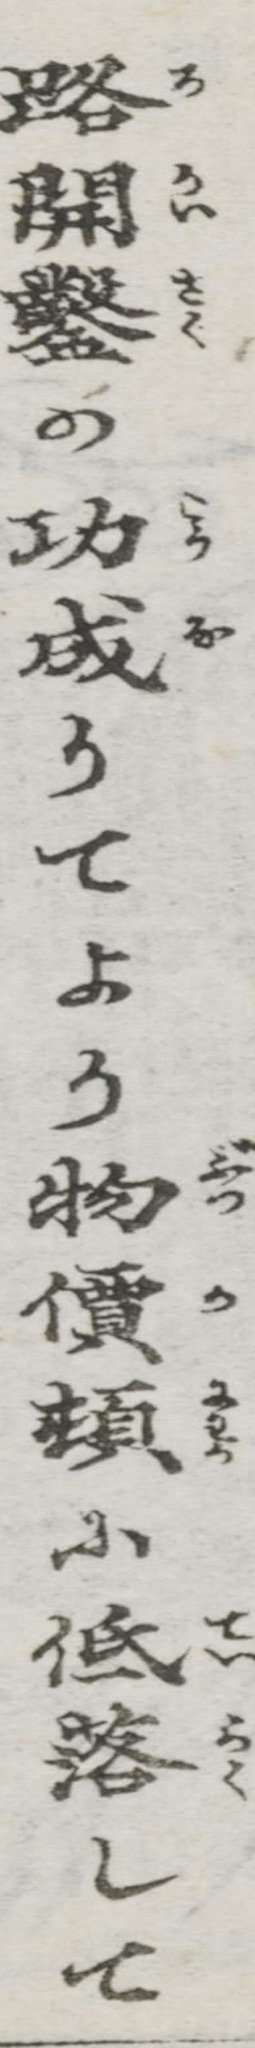路開鑿の功成りてより物價頓に低落して
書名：塩原繁昌記　全
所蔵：東京大学地震研究所図書室 Earthquake Research Institute Library, The University of Tokyo, JAPAN
